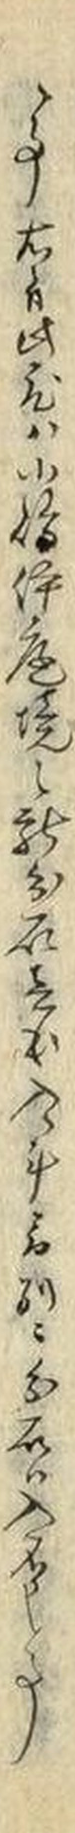候事右に付此度は小島伊庭境之新分石壱本入候斗にて別に分石は入不申候事
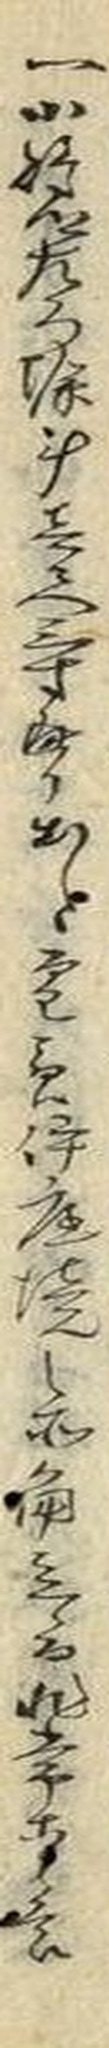一小島郷左衛門塀斗壱尺三寸通り出し候而已にては伊庭境之所角立候て非常等之節
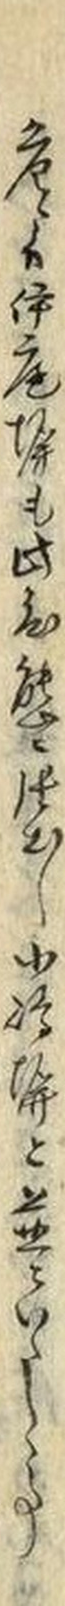危候に付伊庭塀も此度態々張出し小島塀と並にいたし候事
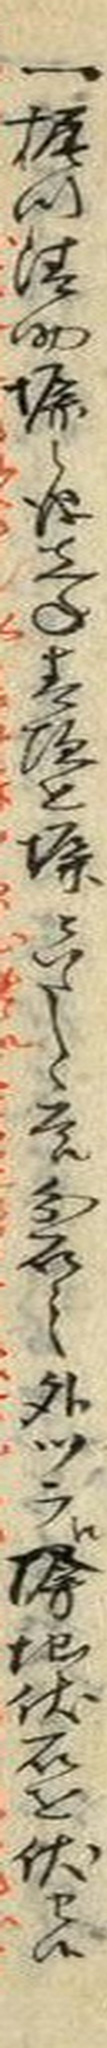一梶川清助塀之儀先年青垣を塀にいたし候節分石之外ツラえ塀地伏石を伏セ候
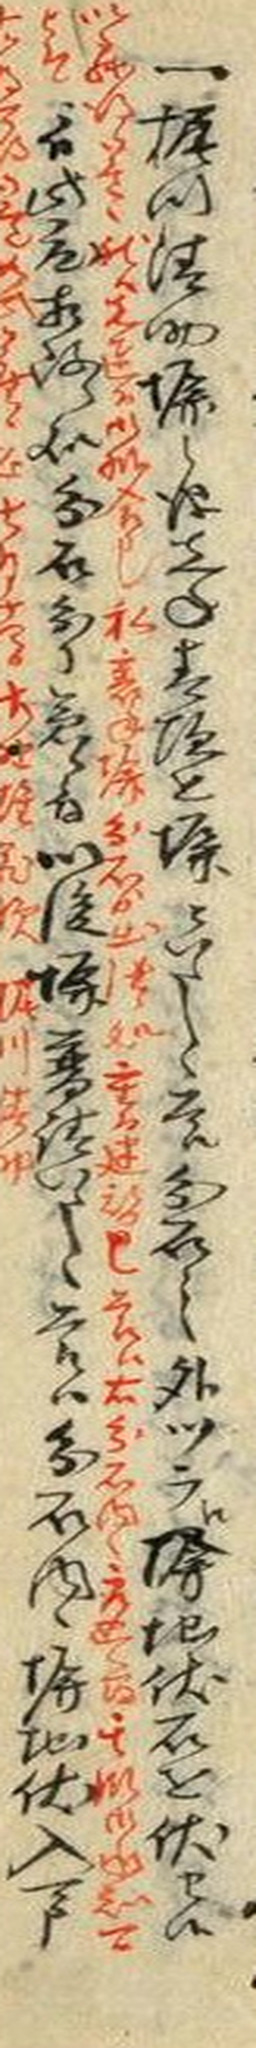に付此度相改候処分石分り兼候に付以後塀普請いたし候節は分石内へ塀地伏入可申

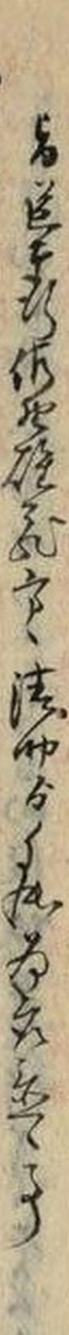旨道奉行佐野雄蔵方へ清助ゟ手紙為取置候事
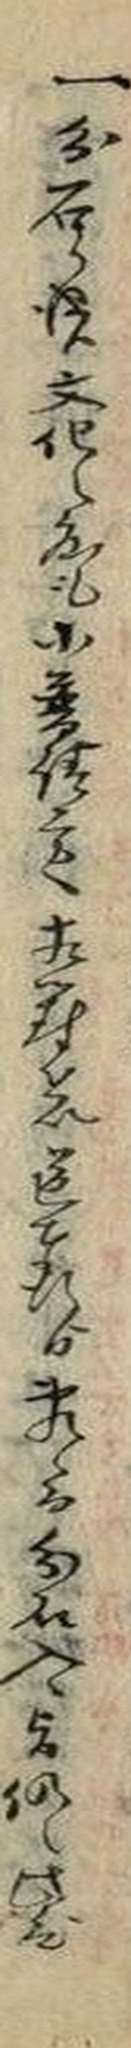一分石之儀は文化之度も小普請方へ相対を以道奉行ゟ頼候て分石入候旨仍之此度
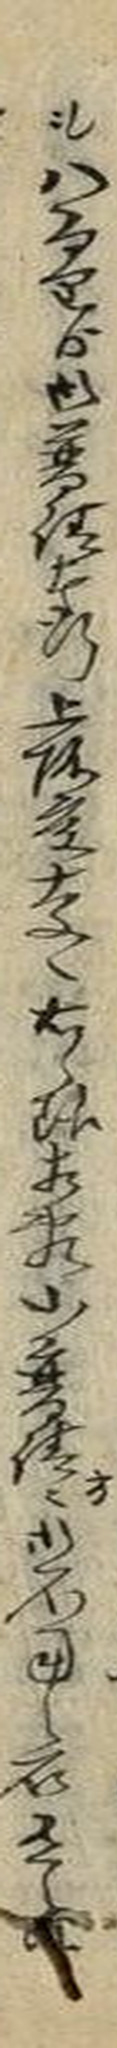も八百里ゟ御普請奉行上坂藤大夫へ右之趣相頼小普請方に御不用之石有之由
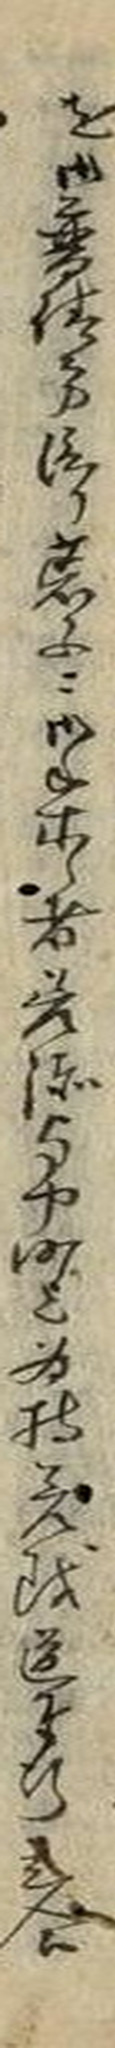を御普請方渡り荒子に御手木之者差添与力町迄為持差越道奉行立合
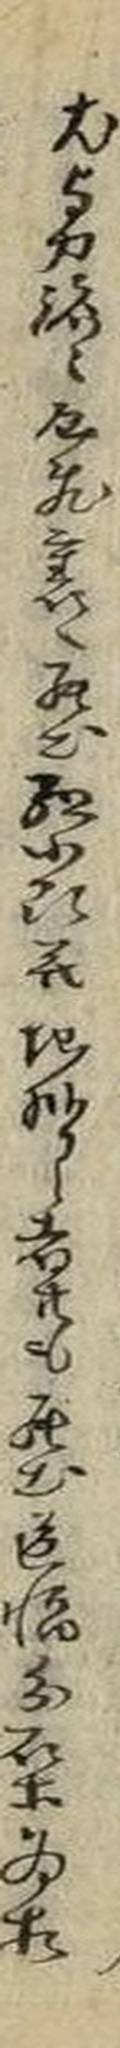尤与力銘々屋敷裏へ罷出組小頭并地掛り之者共も罷出道幅分石等為相
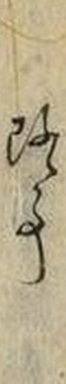改候事
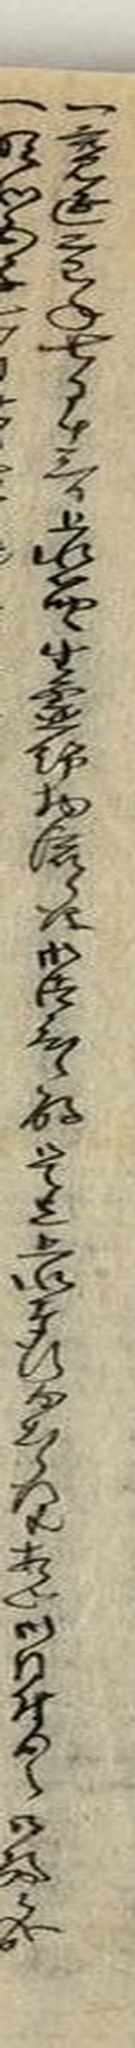一寛延二巳年七月十三日上水筋へ生霊飾物流候儀御法度之触是迄上水奉行ゟ出候得共相止御目付ゟ之御触被成
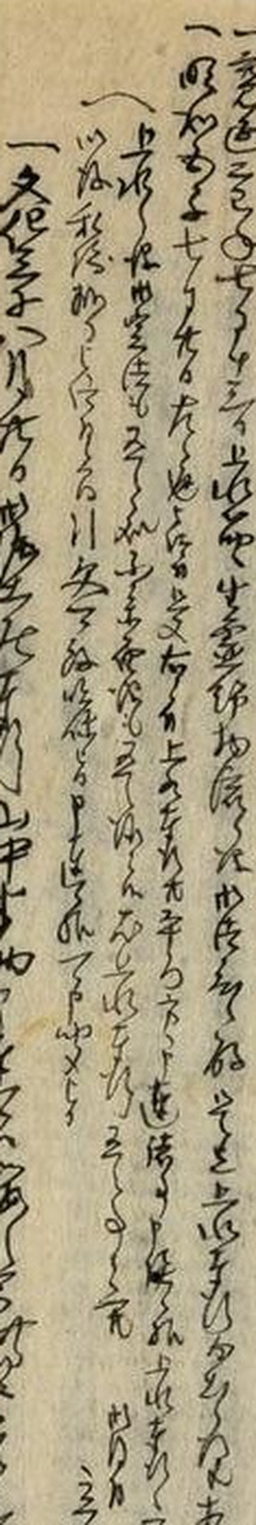上水之儀御定法も有之候処不参届儀も有之趣に候尤上水奉行有之事に候へ共御目付
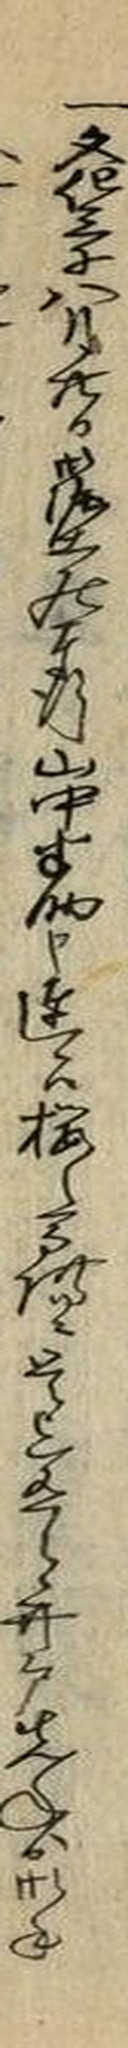一文化三刁八月廿日御堀土居奉行山中半助申達候は桜之馬場に是迄有之候井戸先年ゟ御手
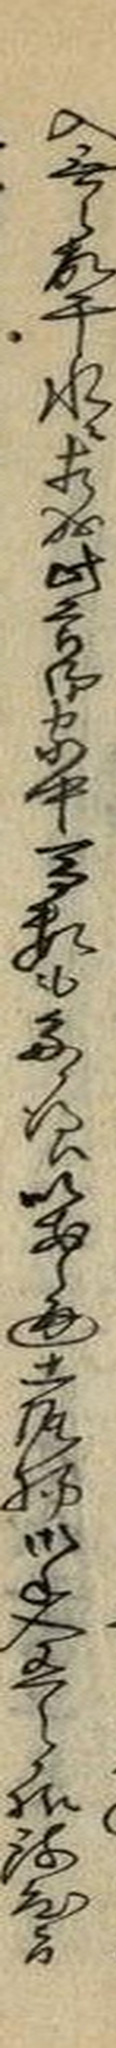入無之故干水に相成此節御家中馬数も多候得は以前之通土掘揚御手入有之候様致度旨
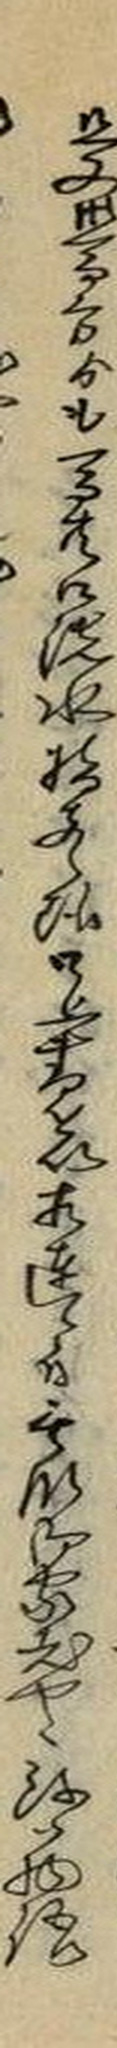且又御馬方ゟも馬共口洗水指支候趣口上書を以相達候に付其段御家老中へ致御物語
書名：御城下諸事之部
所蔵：福井県文書館 Fukui Prefectural Archives
